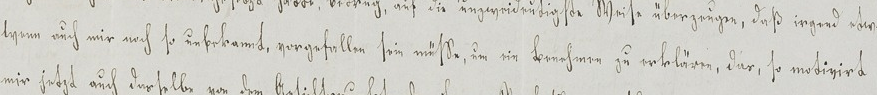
wenn auch mir noch so unbekannt, vorgefallen sein müsse, um ein Benehmen zu erklären, das, so motivirt
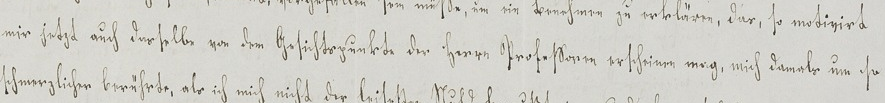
mir jetzt auch dasselbe von dem Gesichtspunkte der Herrn Professoren erscheinen mag, mich damals um so
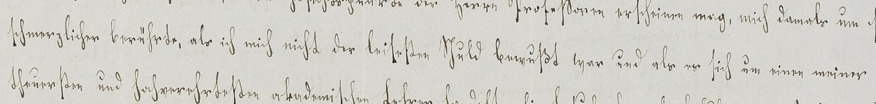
schmerzlicher berührte, als ich mich nicht der leisesten Schuld bewußt war und als es sich um einen meiner
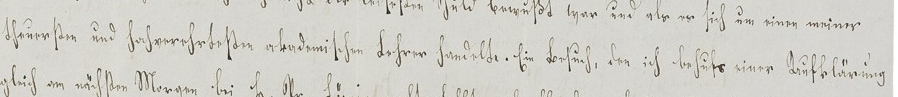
theuersten und hochverehrtesten adademischen Lehrer handelte. Ein Besuch, den ich behufs einer Aufklärung
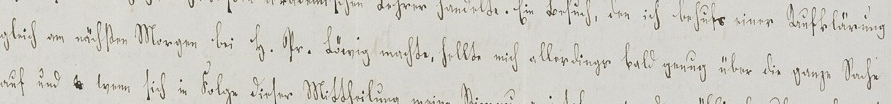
gleich am nächsten Morgen bei H. Pr. Löwig machte, hellte mich allerdings bald genug über die ganze Sache
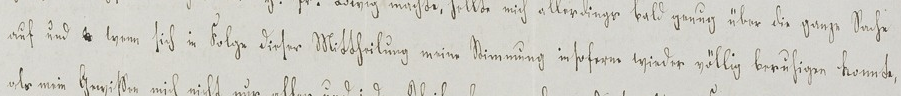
auf und ... wenn sich in Folge dieser Mittheilung meine Stimmung insofern wieder völlig beruhigen konnte,
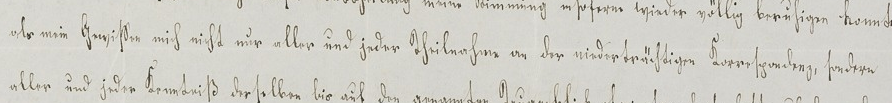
als mein Gewissen mich nicht nur aller und jeder Theilnahme an der niederträchtigen Korrespondenz, sondern
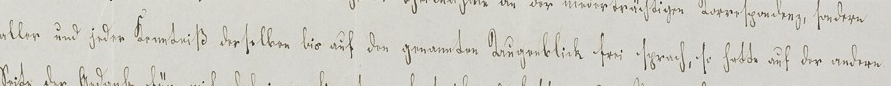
aller und jeder Kenntniß derselben bis auf den genannten Augenblick frei sprach, so hatte auf der andern
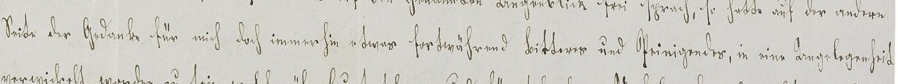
Seite der Gedanke für mich doch immerhin etwas fortwährend Bitteres und Peinigendes, in eine Angelegenheit
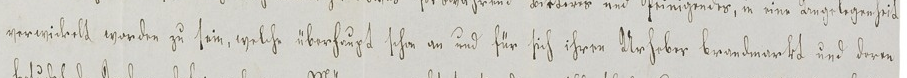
verwickelt worden zu sein, welche überhaupt schon an und für sich ihren Urheber brandmarkt und deren
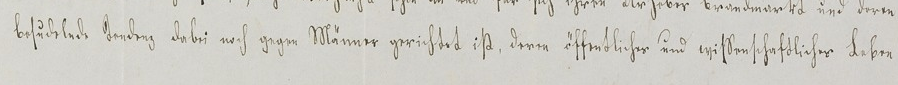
besudelnde Tendenz dabei noch gegen Männer gerichtet ist, deren öffentliches und wissenschaftliches Leben
